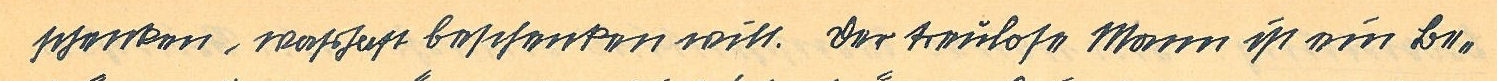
schenken, wahrhaft beschenken will. Der treulose Mann ist ein Be¬
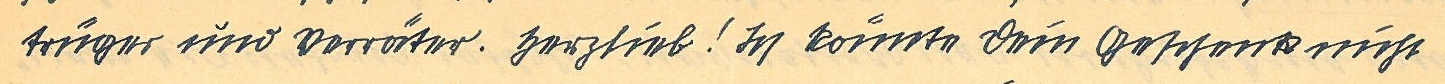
trüger und Verräter. Herzlieb! Ich könnte Dein Geschenk nicht
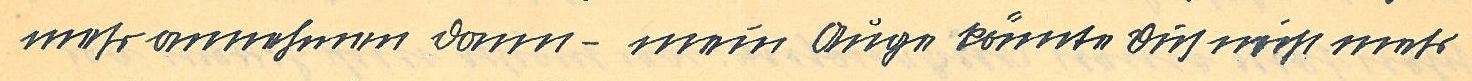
mehr annehmen dann – mein Auge könnte Dich nicht mehr
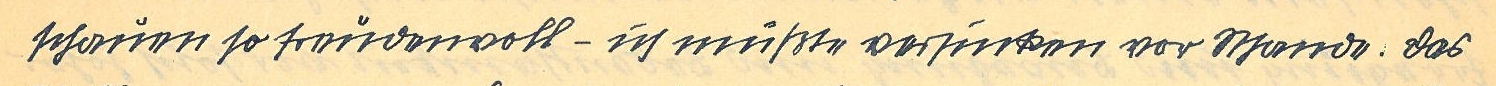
schauen so freudenvoll – ich müßte versinken vor Schande. Das
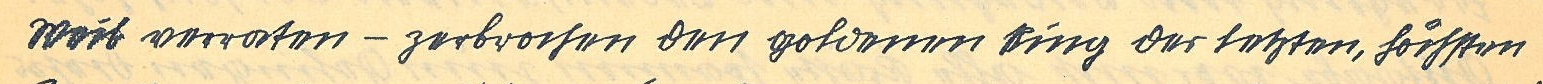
Weib verraten – zerbrochen den goldenen Ring der letzten, höchsten
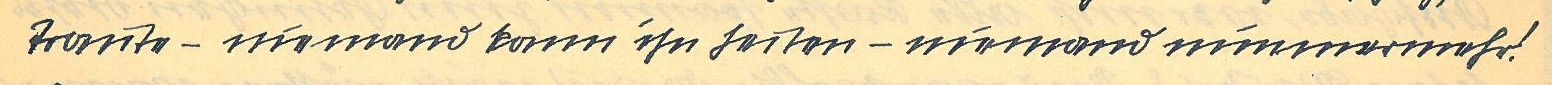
Traute – niemand kann ihn heilen – niemand nimmermehr!
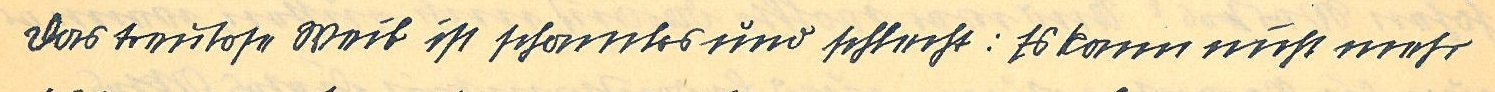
Das treulose Weib ist schamlos und schlecht: Es kann nicht mehr
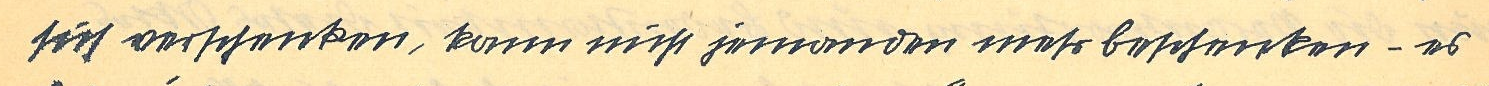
sich verschenken, kann nicht jemanden mehr beschenken – es
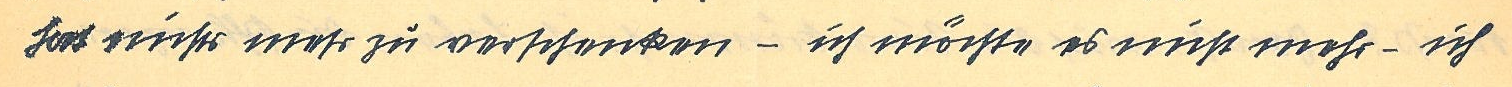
hat nichts mehr zu verschenken – ich möchte es nicht mehr – ich
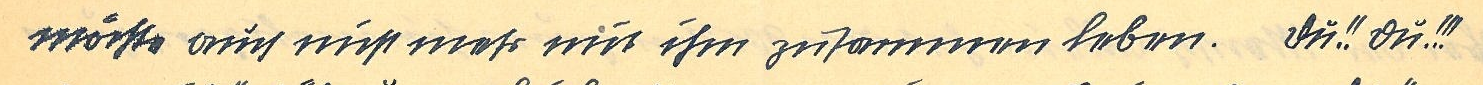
möchte auch nicht mehr mit ihm zusammen leben. Du!! Du!!!
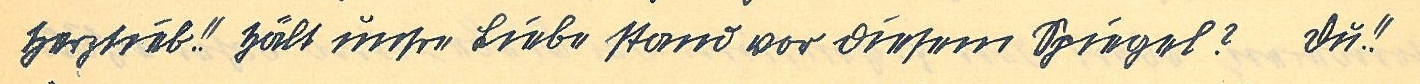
Herzlieb!! Hält unsre Liebe stand vor diesem Spiegel? Du!!
